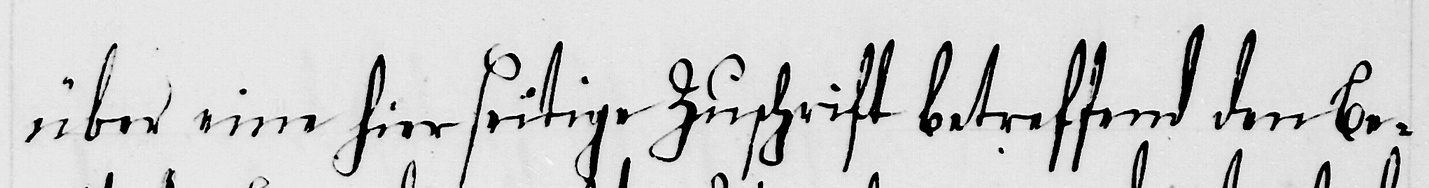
über eine hierseitige Zuschrift betreffend den Ber¬
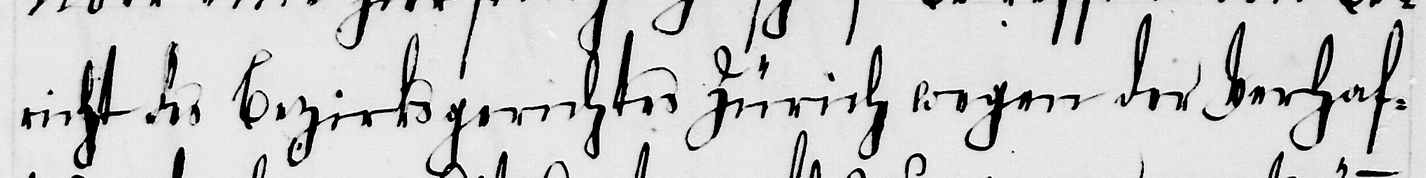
icht des Bezirksgerichtes Zürich wegen der Verhaf¬
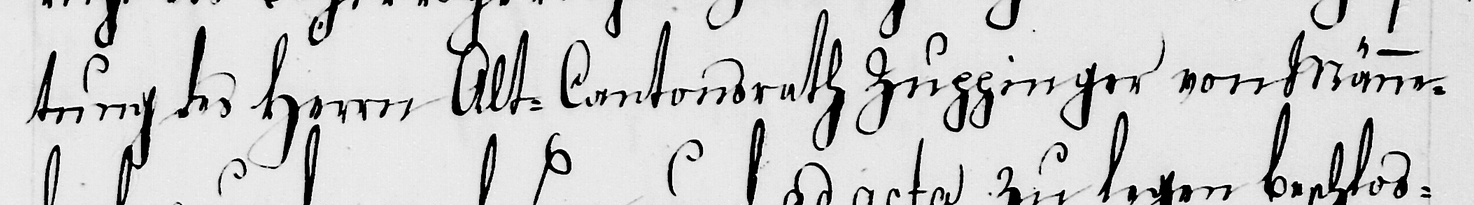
tung des Herrn Alt-Cantonsrath Zuppinger von Männe¬
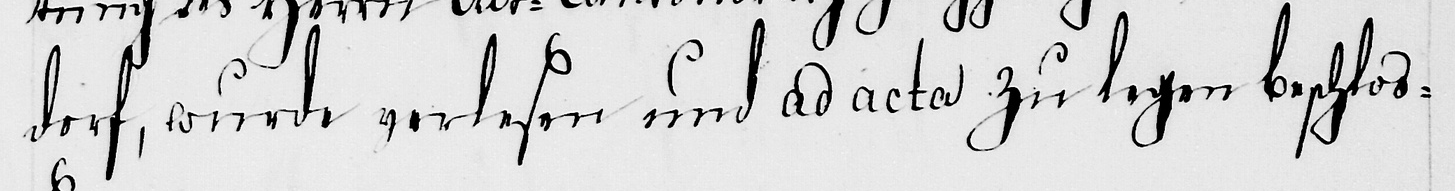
dorf, wurde verlesen und ad acta zu legen beschloß¬
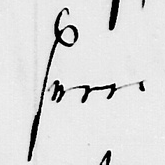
en.
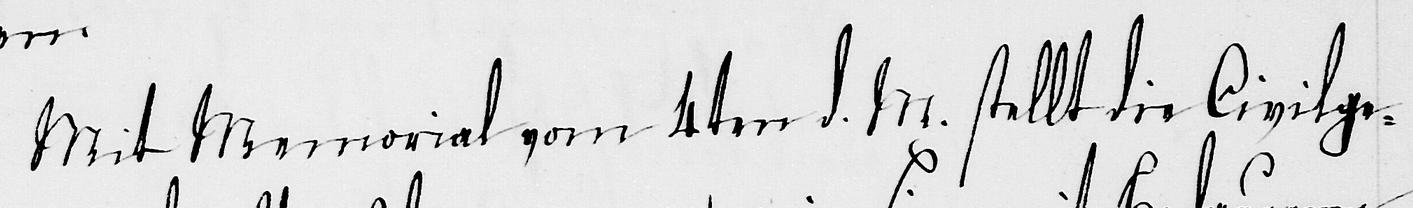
Mit Memorial vom 4ten d. M. stellt die Civilge¬
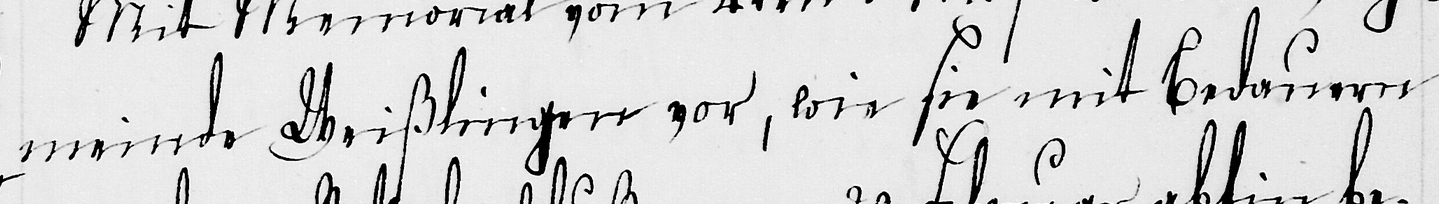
meinde Weißlingen vor, wie sie mit Bedauern
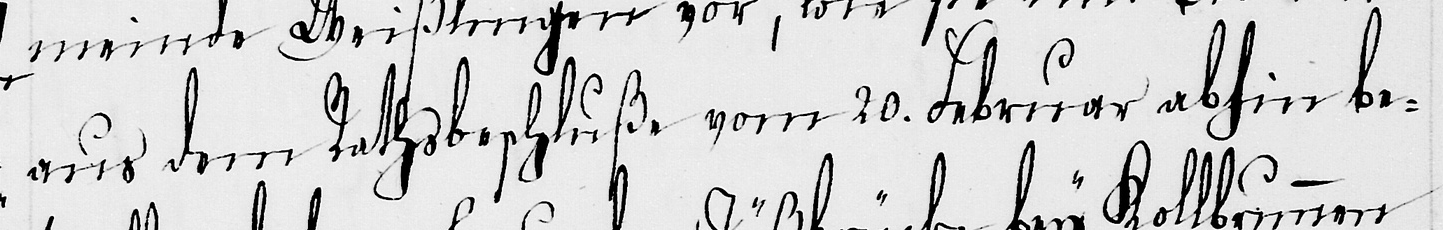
aus dem Rathsbeschluße vom 20. Februar abhin be¬
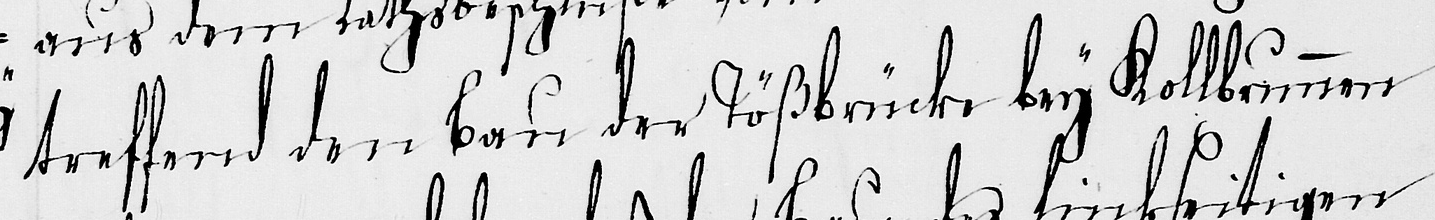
treffend den Bau der Tößbrücke bey Kollbrunnen
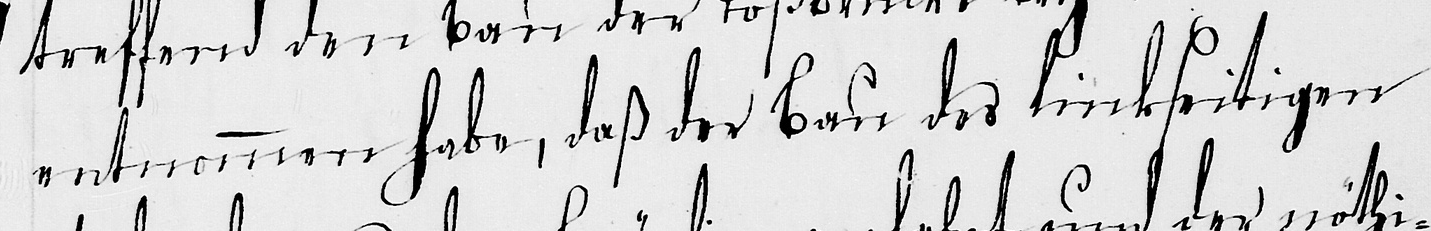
entnommen habe, daß der Bau des linkseitigen
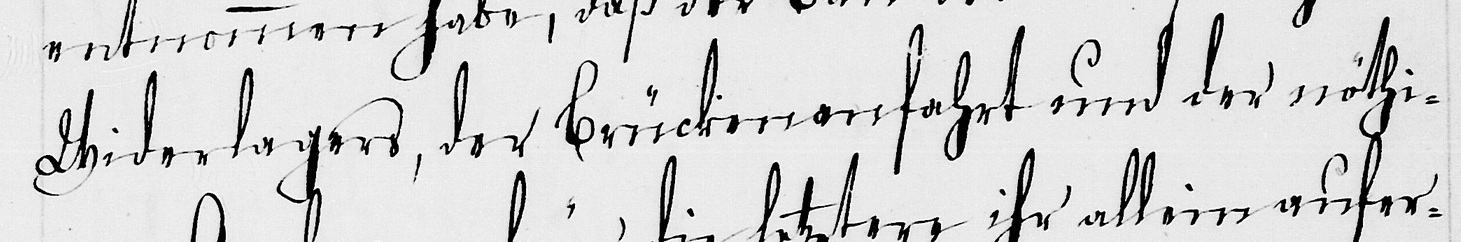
Widerlagers, der Brückenanfahrt und der nöthi¬
